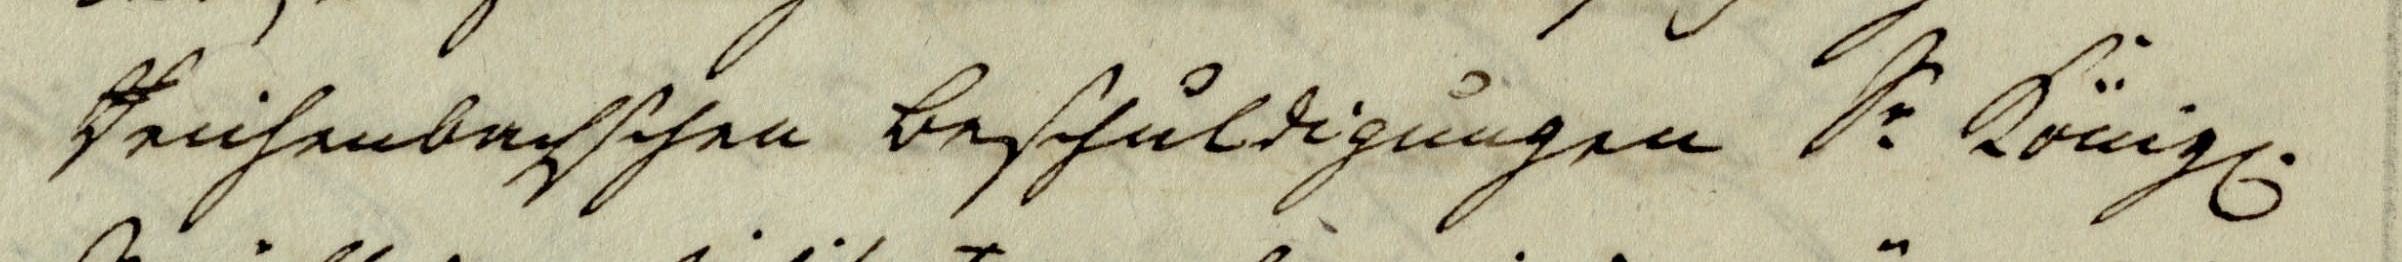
Reichenbachschen Beschuldigungen Sr Königl.
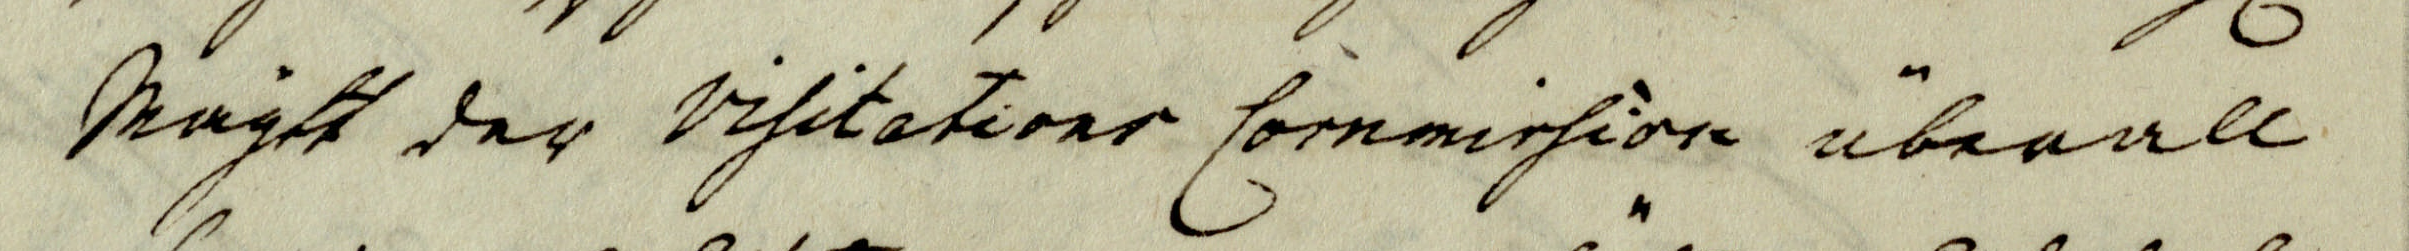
Maÿtt der Visitations Commission überall
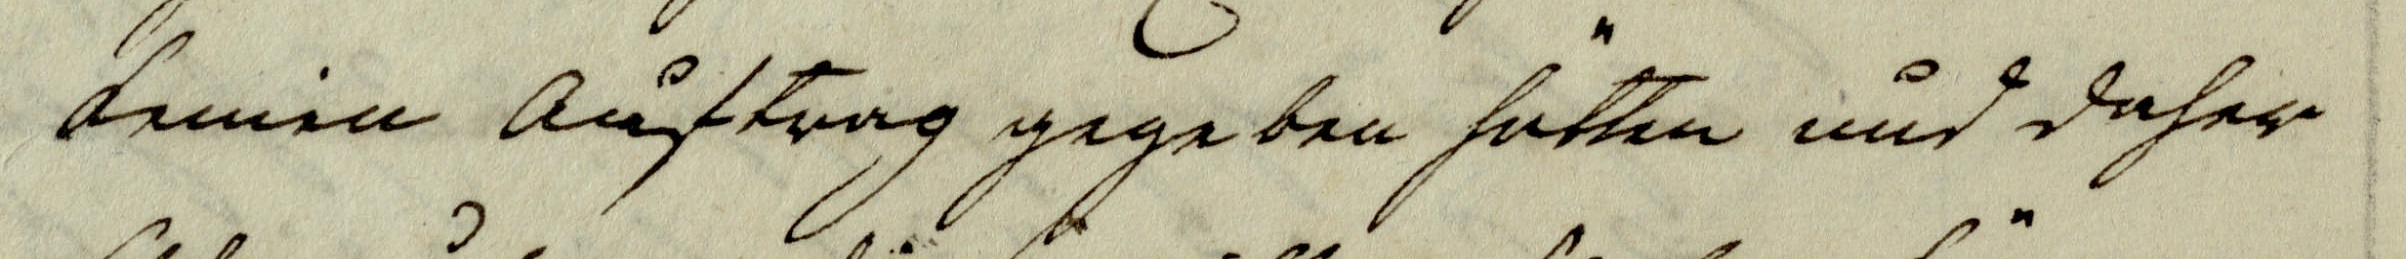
keinen Auftrag gegeben hätten und daher
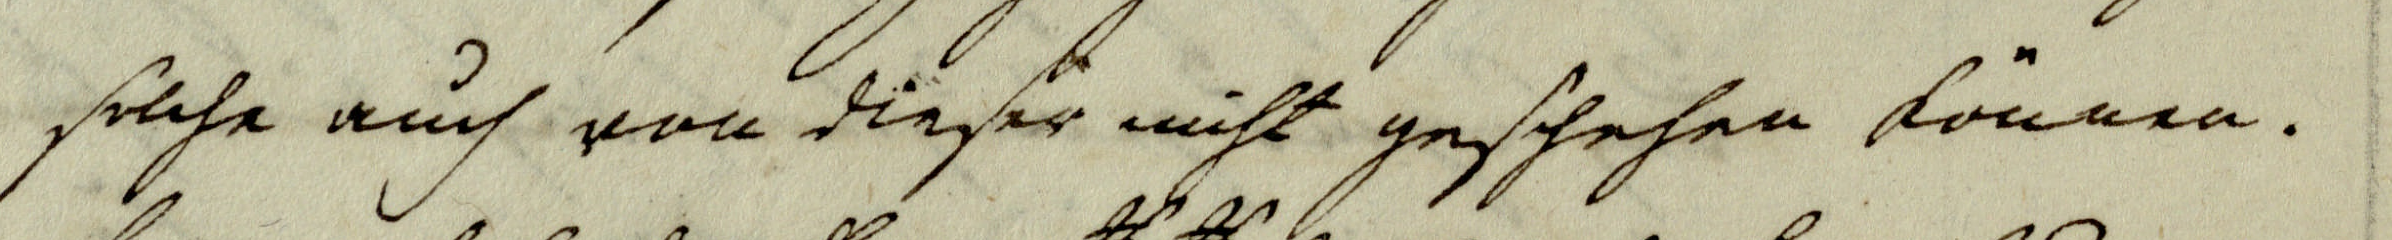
solche auch von dieser nicht geschehen können.
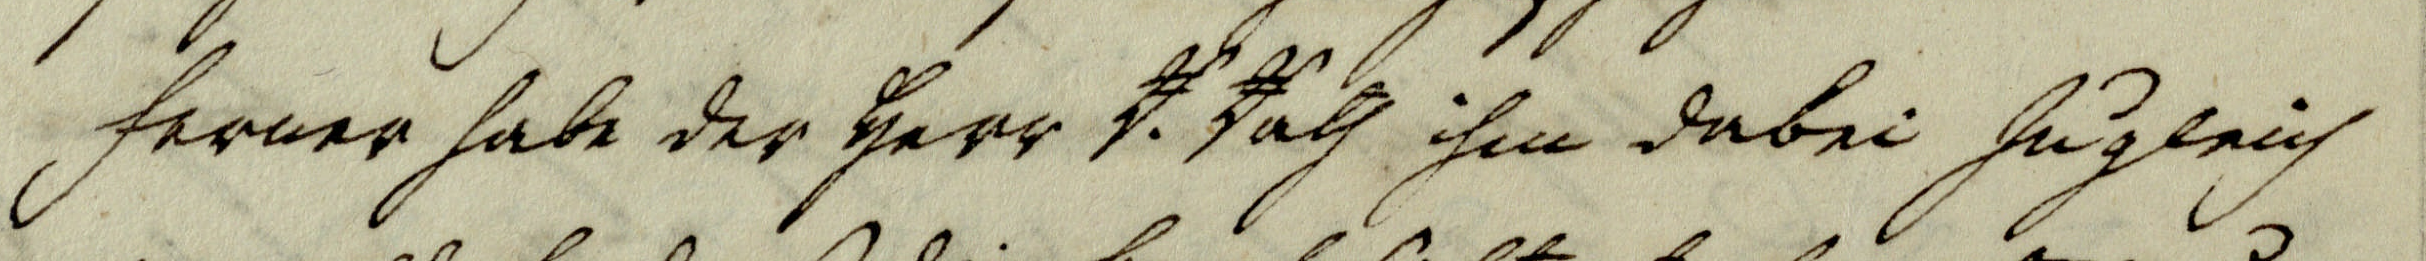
Ferner habe der Herr R. Rath ihm dabei zugleich
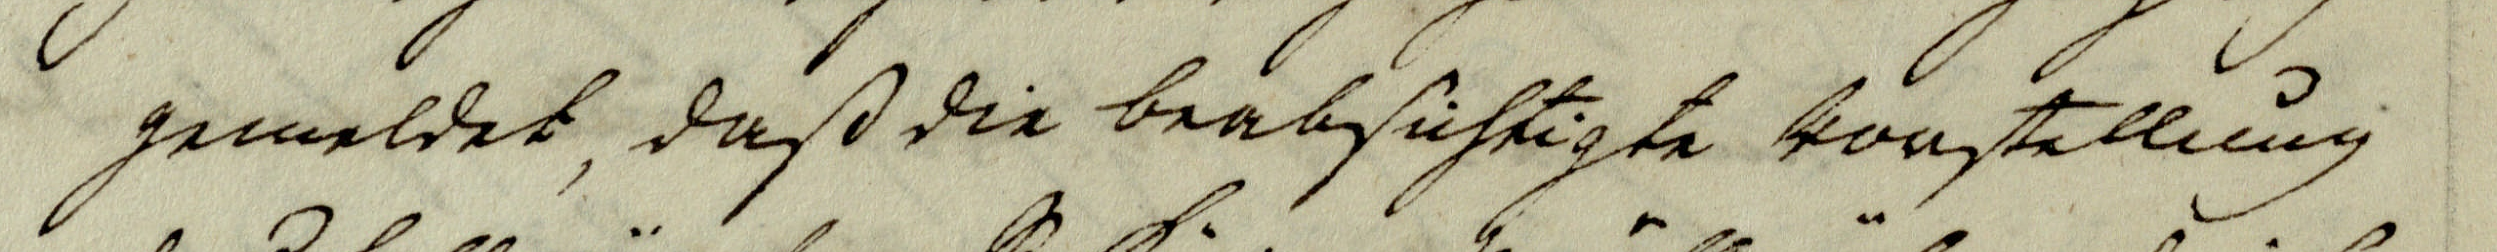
gemeldet, daß die beabsichtigte Vorstellung
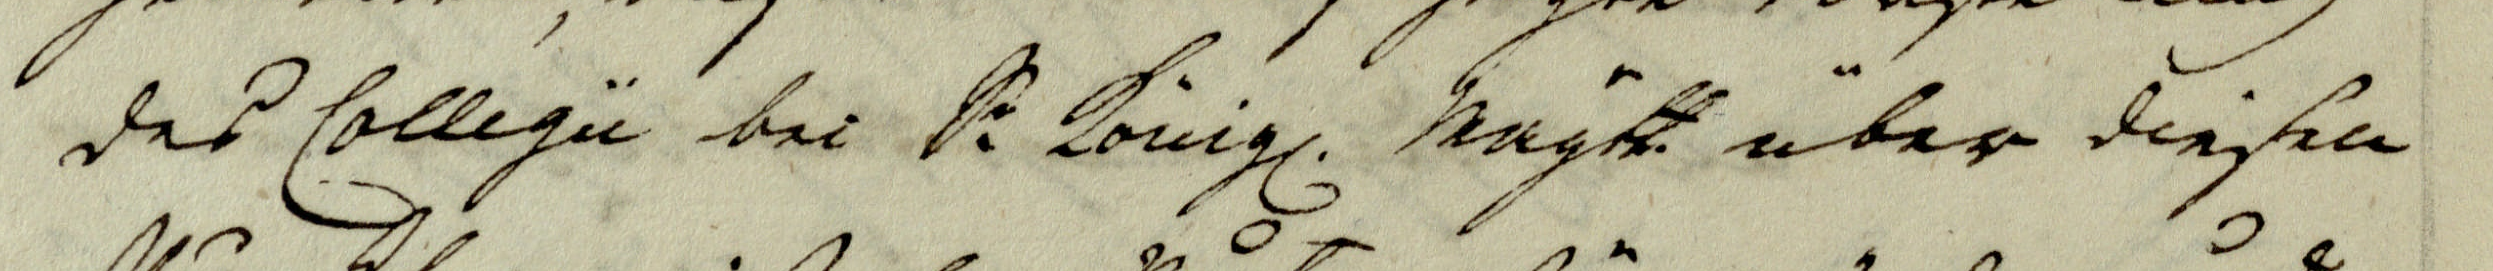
des Collegii bei Sr Königl. Maÿtt über diesen
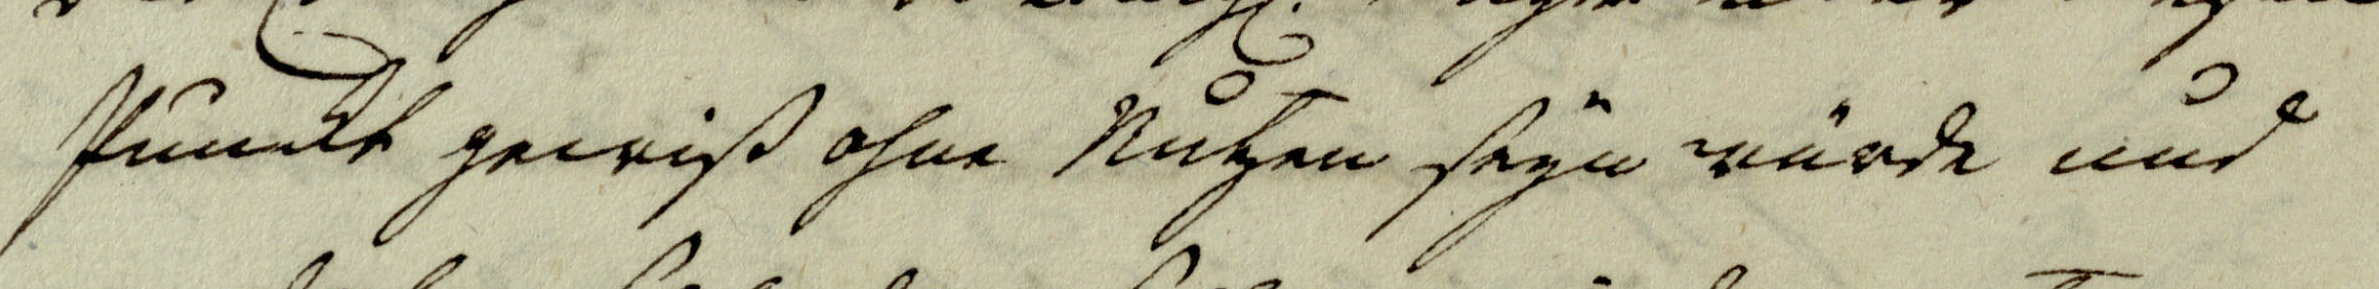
Punckt gewiß ohne Nutzen seÿn würde und
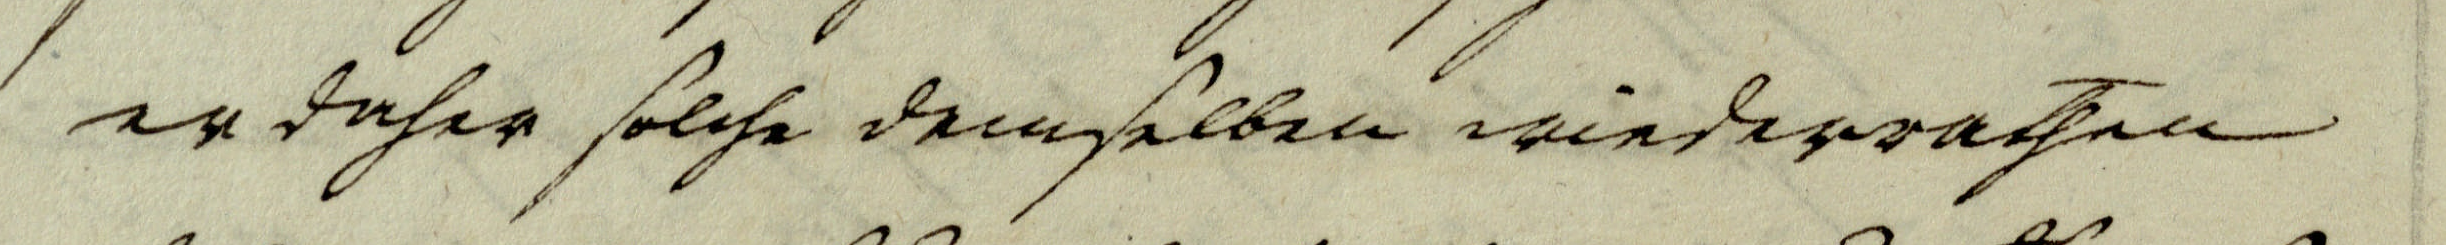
er daher solche demselben wiederrathen
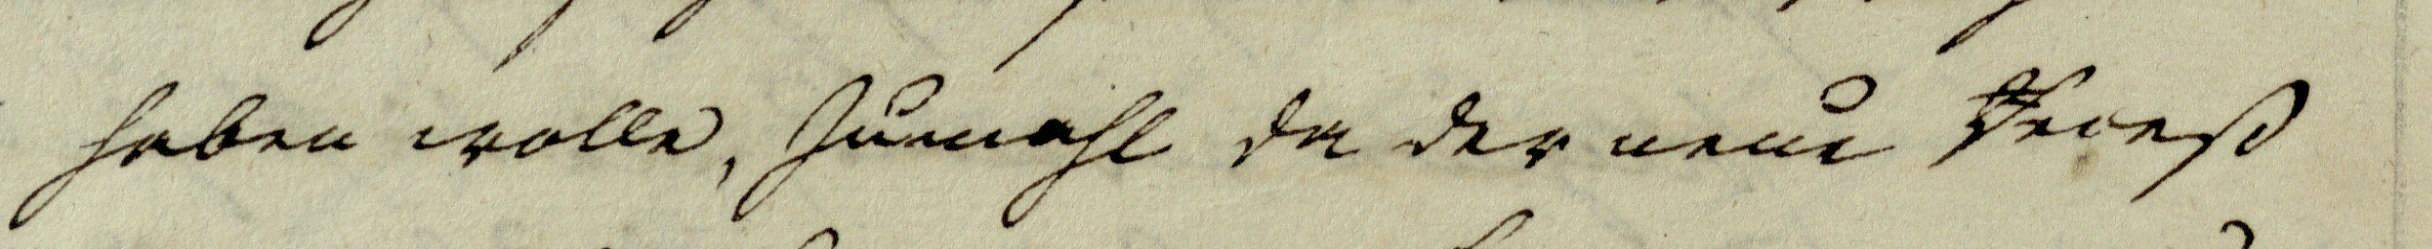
haben wolle, zumahl da der neue Receß
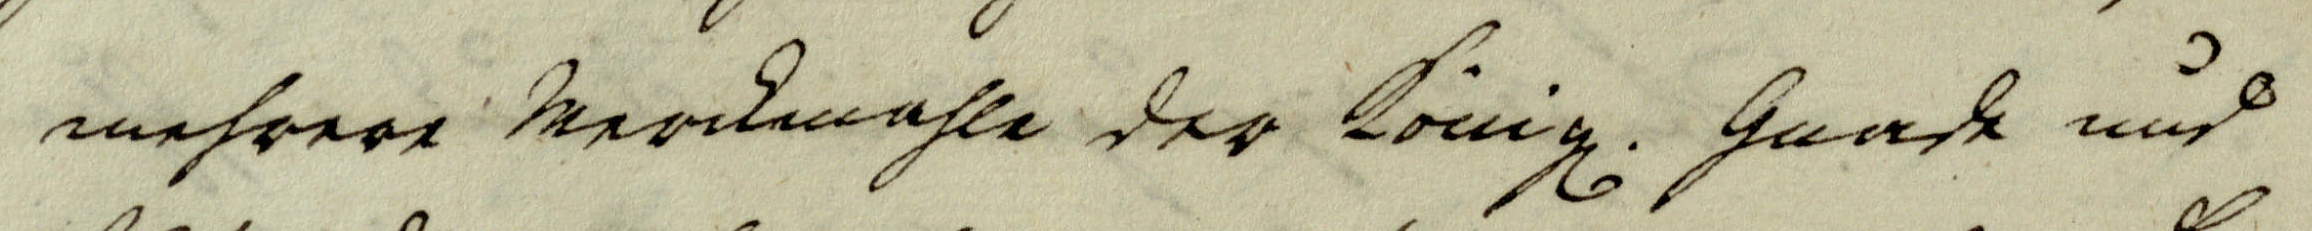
mehrere Merckmahle der Königl. Gnade und
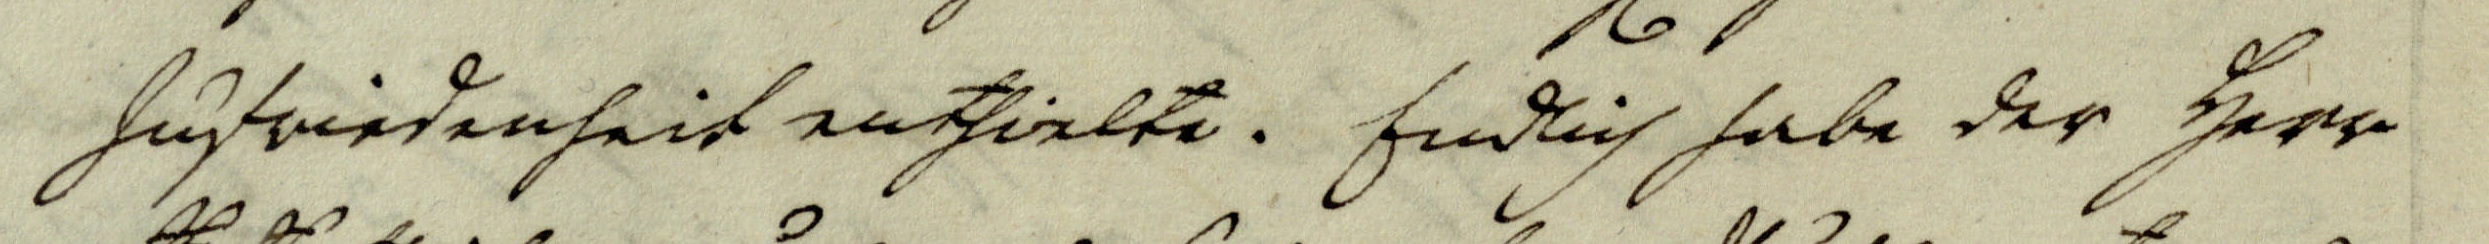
Zufriedenheit enthielte. Endlich habe der Herr
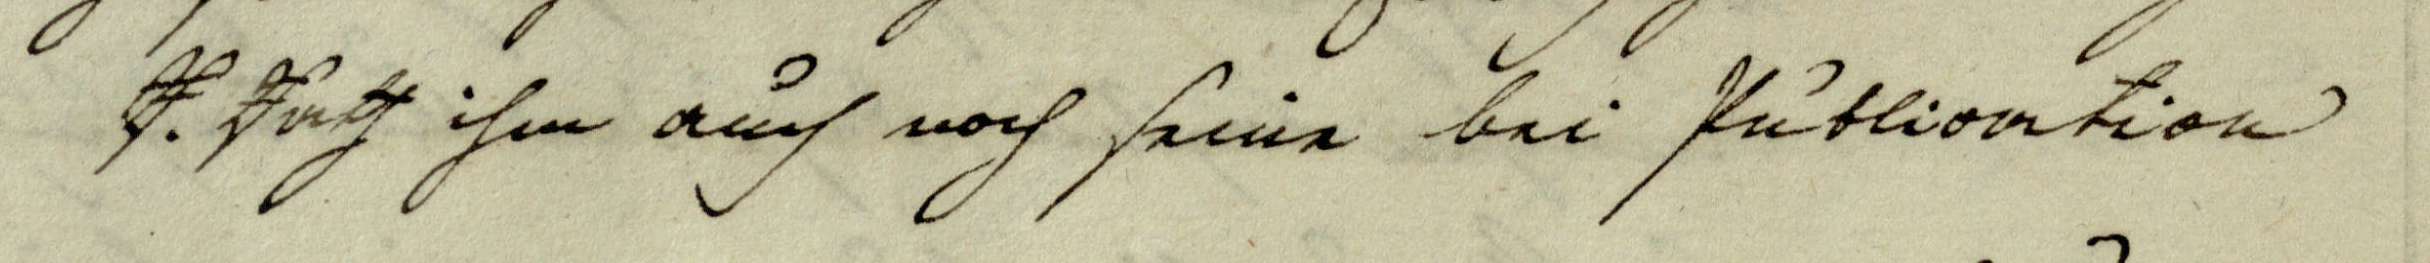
R. Rath ihm auch noch seine bei Publication
